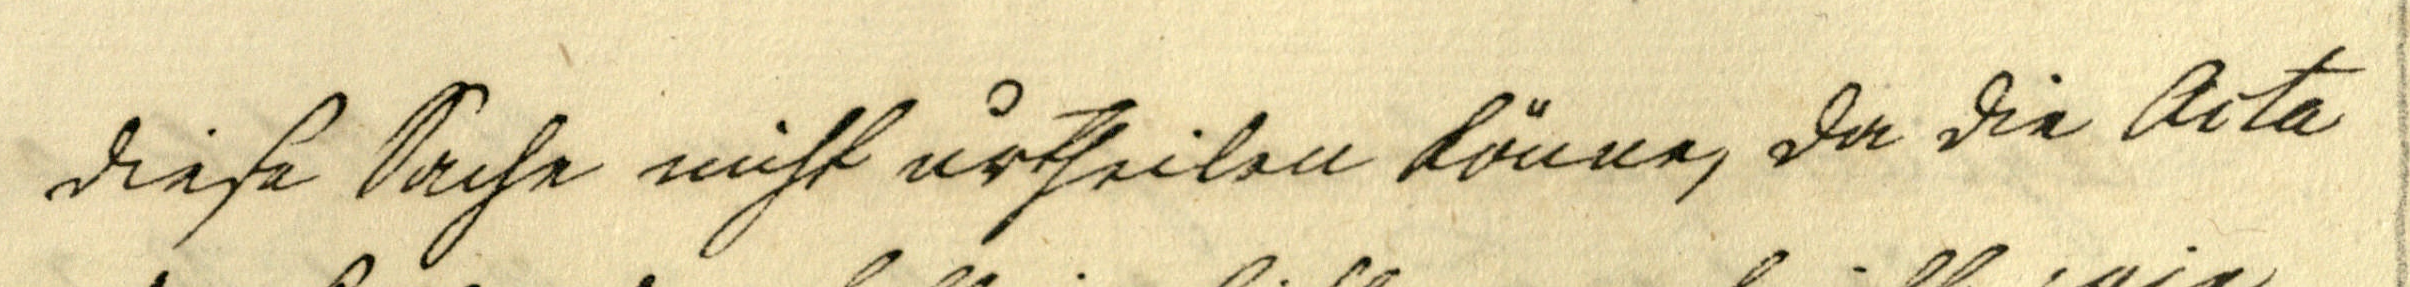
diese Sache nicht urtheilen könne, da die Acta
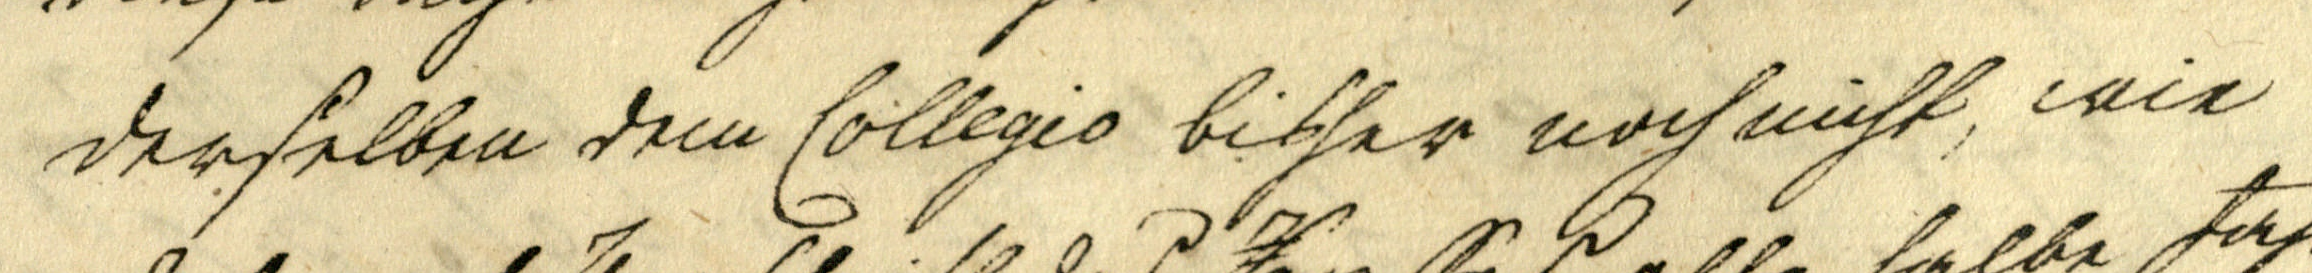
derselben dem Collegio bisher noch nicht, wie
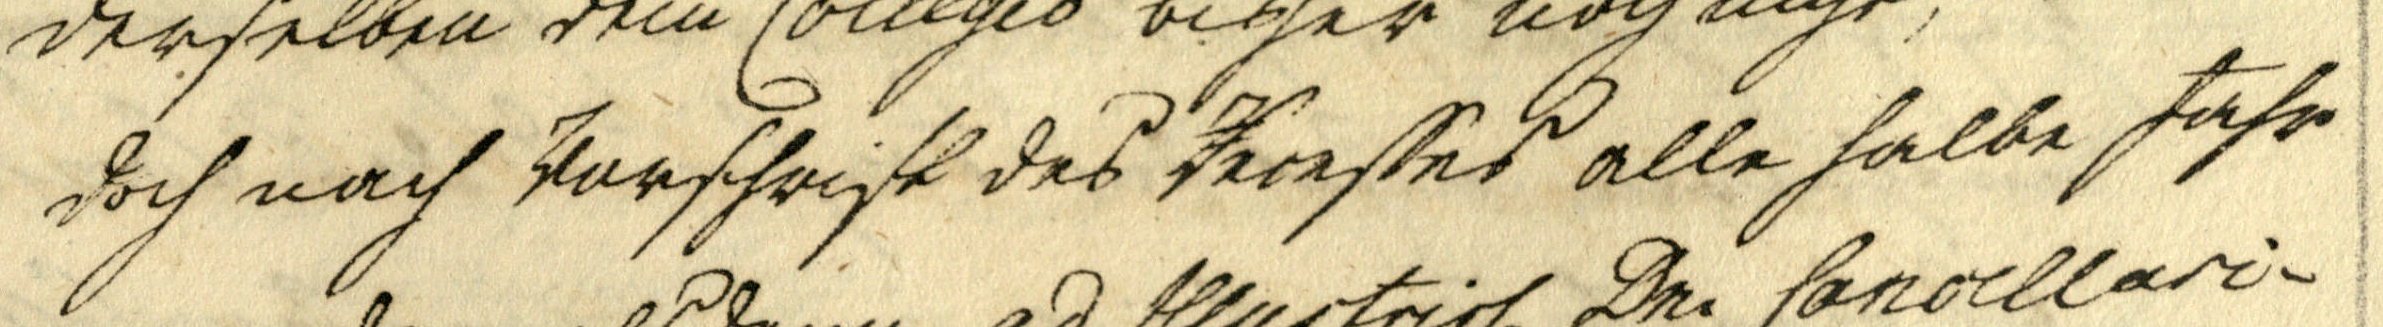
doch nach Vorschrift der Recesses alle halbe Jahr
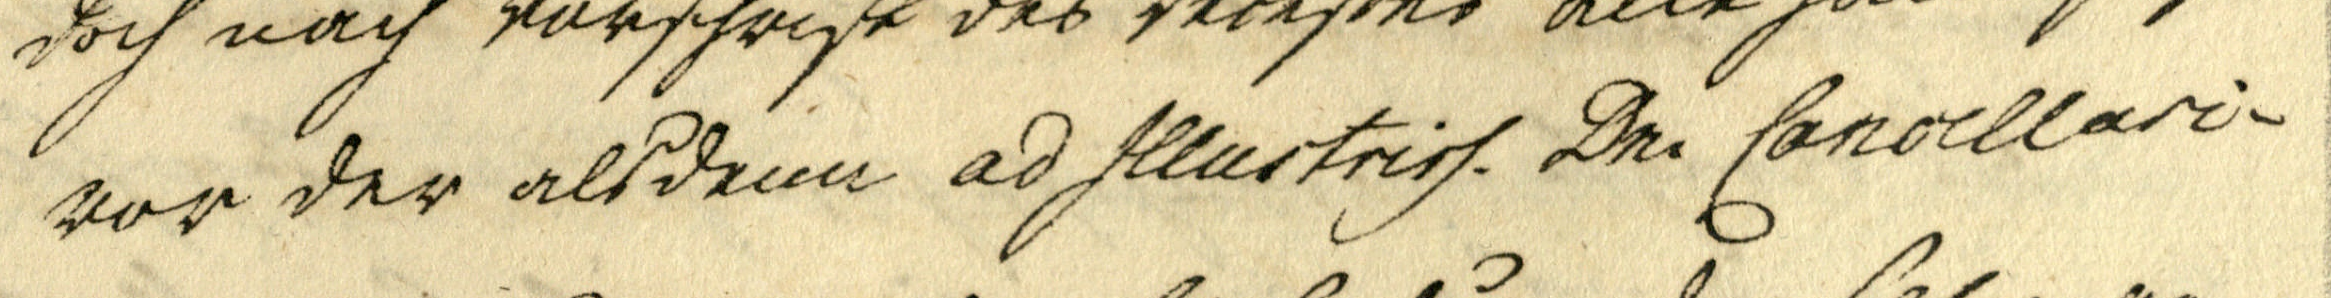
vor der alsdenn ad Illustriss. Dn. Cancellari¬
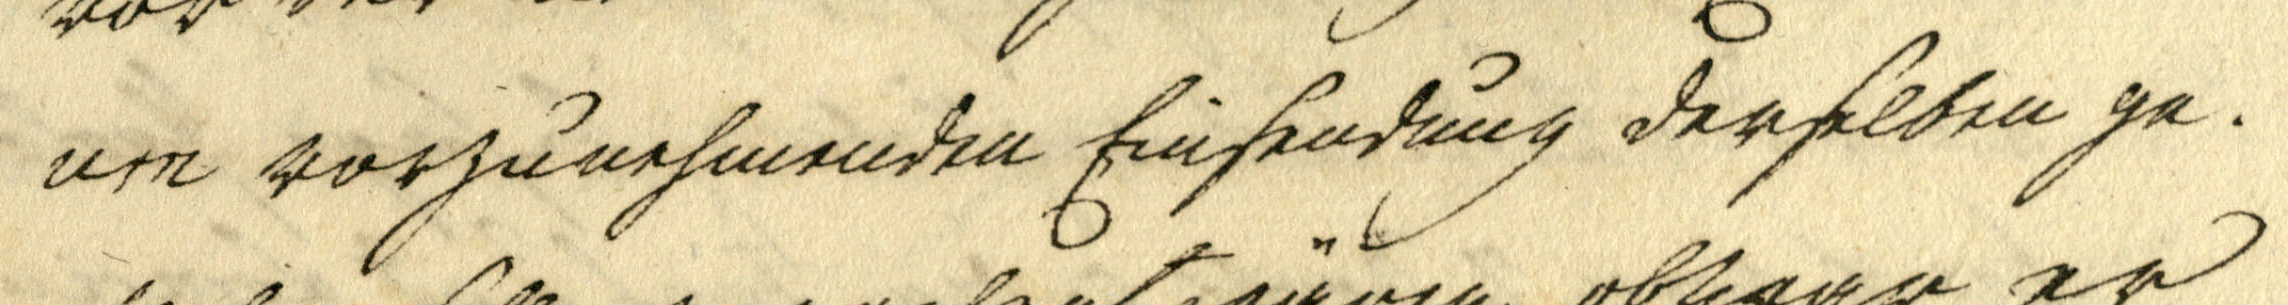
um vorzunehmenden Einsendung derselben ge¬
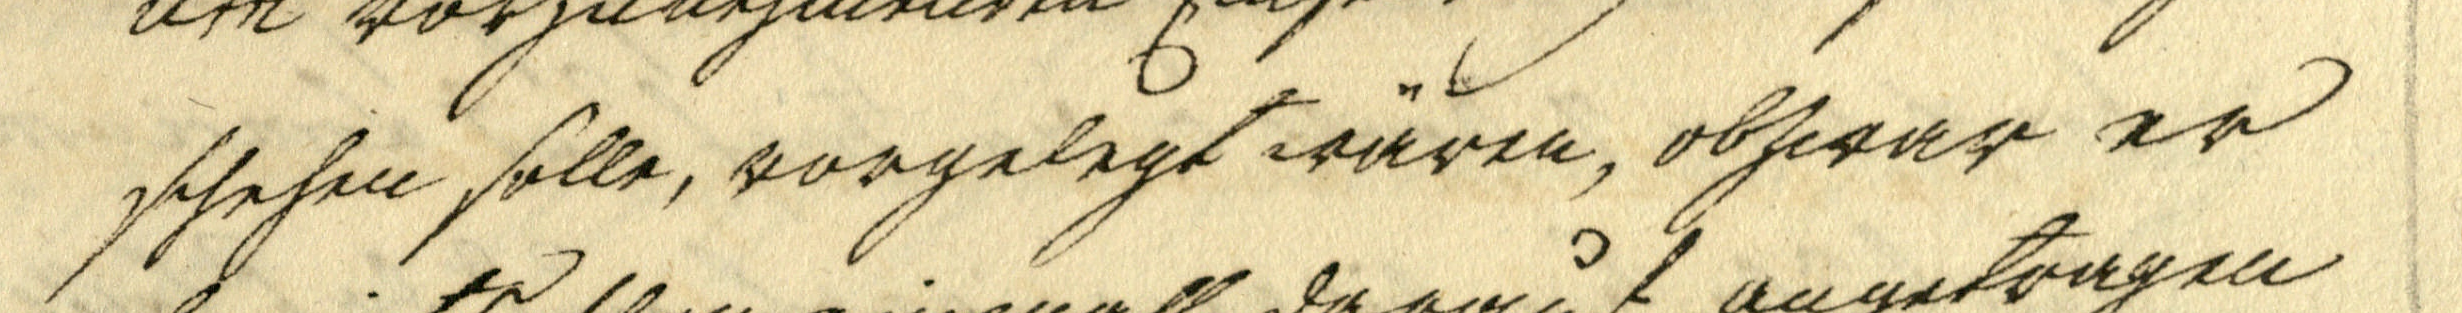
schehen solle, vorgelegt wären, obzwar er
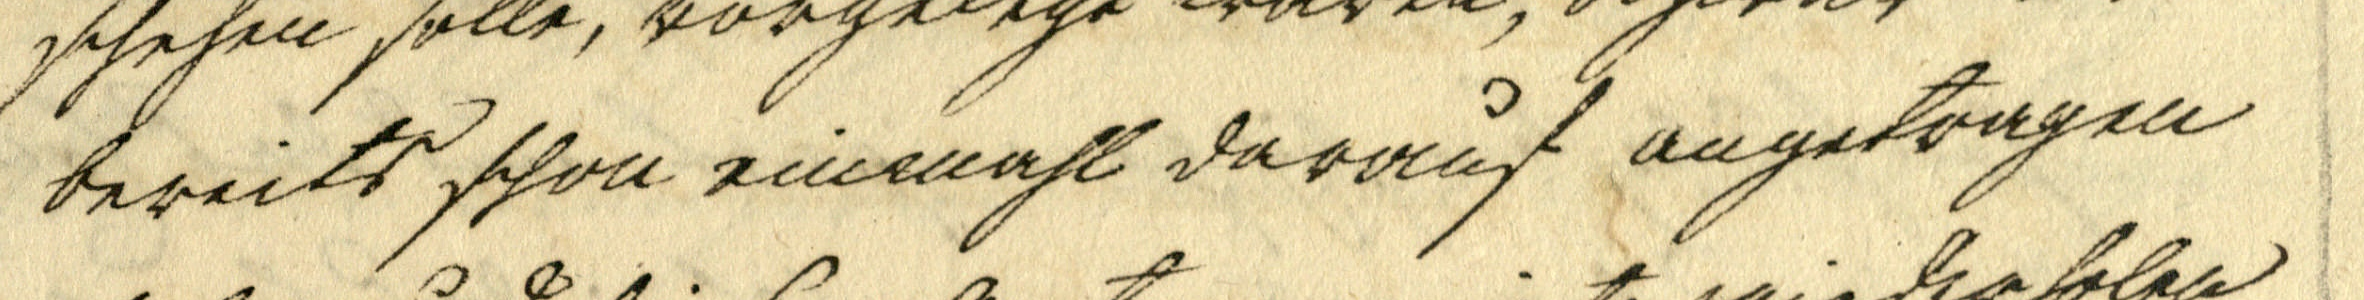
bereits schon einmahl darauf angetragen
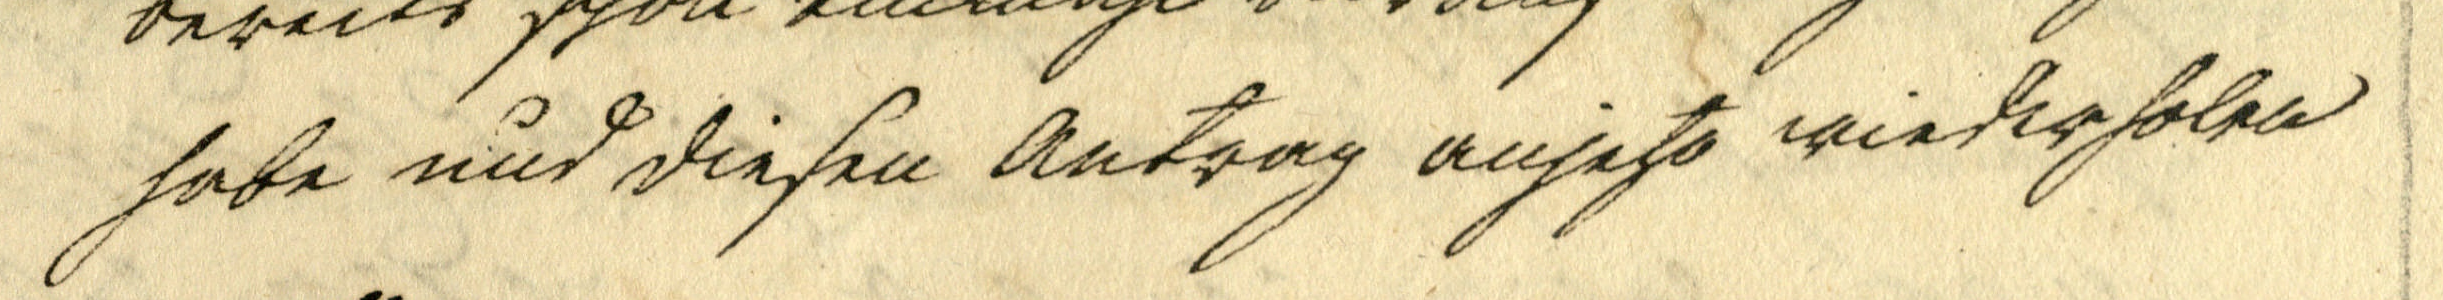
habe und diesen Antrag anjetzo wiederholen
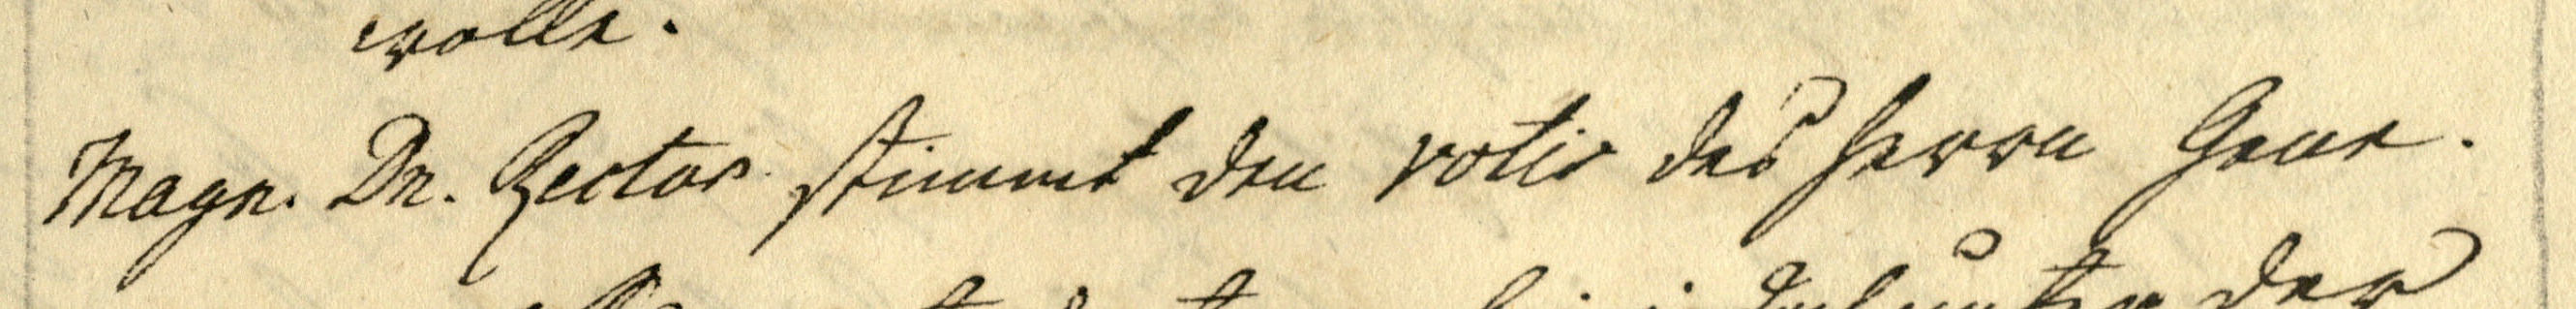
Magn. Dn. Rector stimmt den votis des Herrn Gene¬
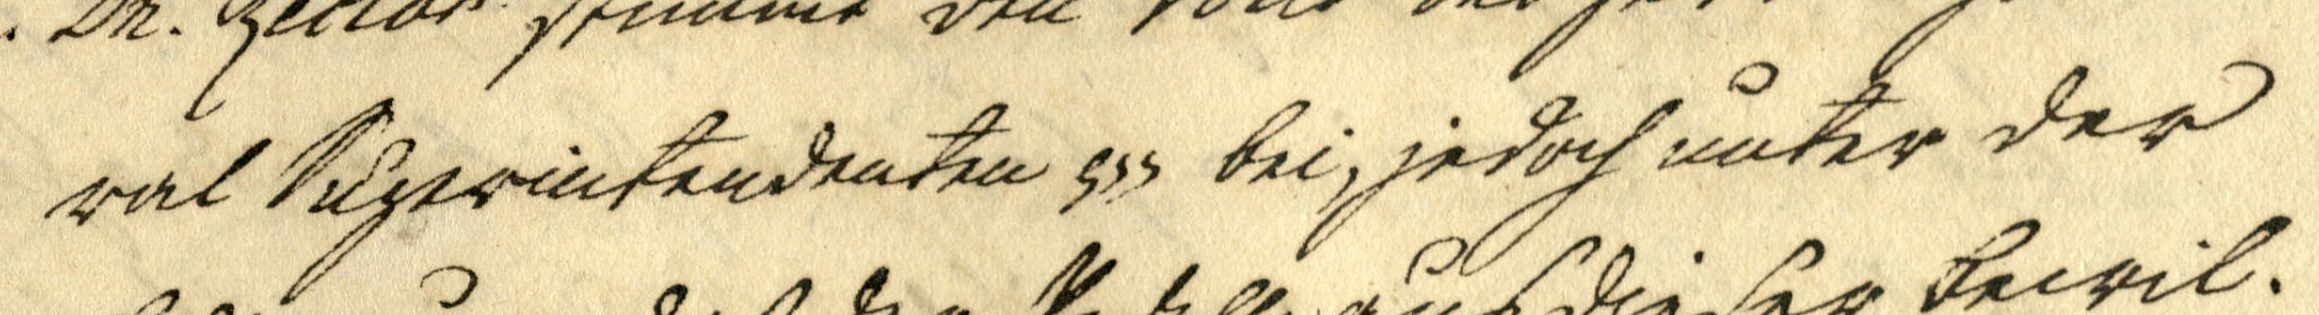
ral Superintendenten v, bei, jedoch unter der
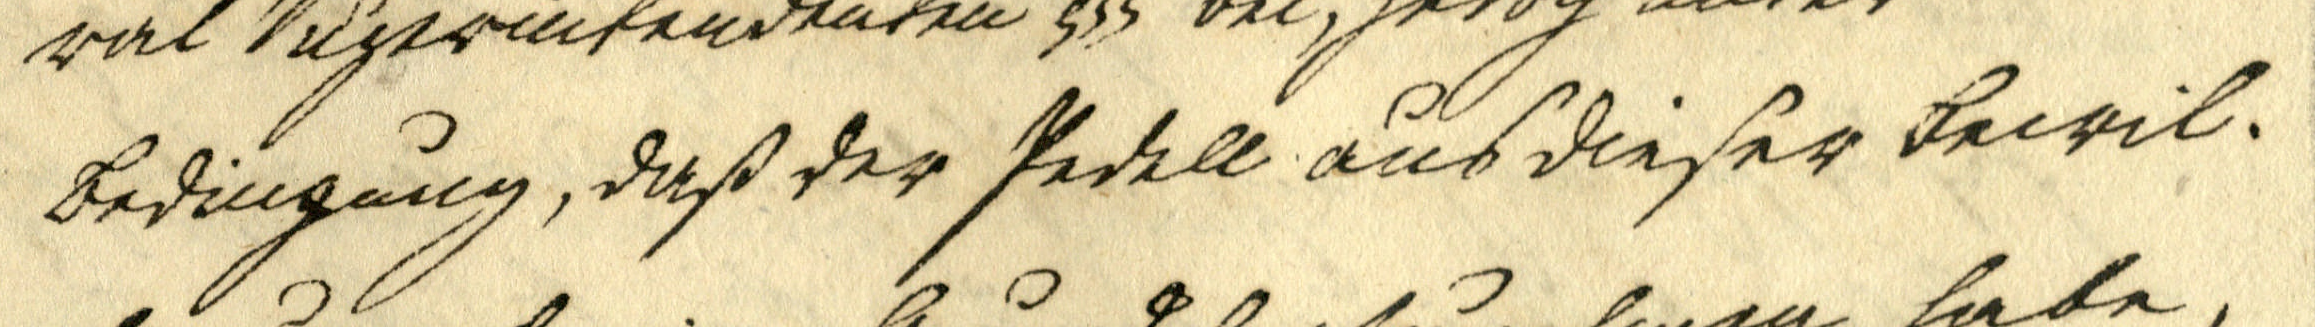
Bedingung, daß der Pedell aus dieser Bewil¬
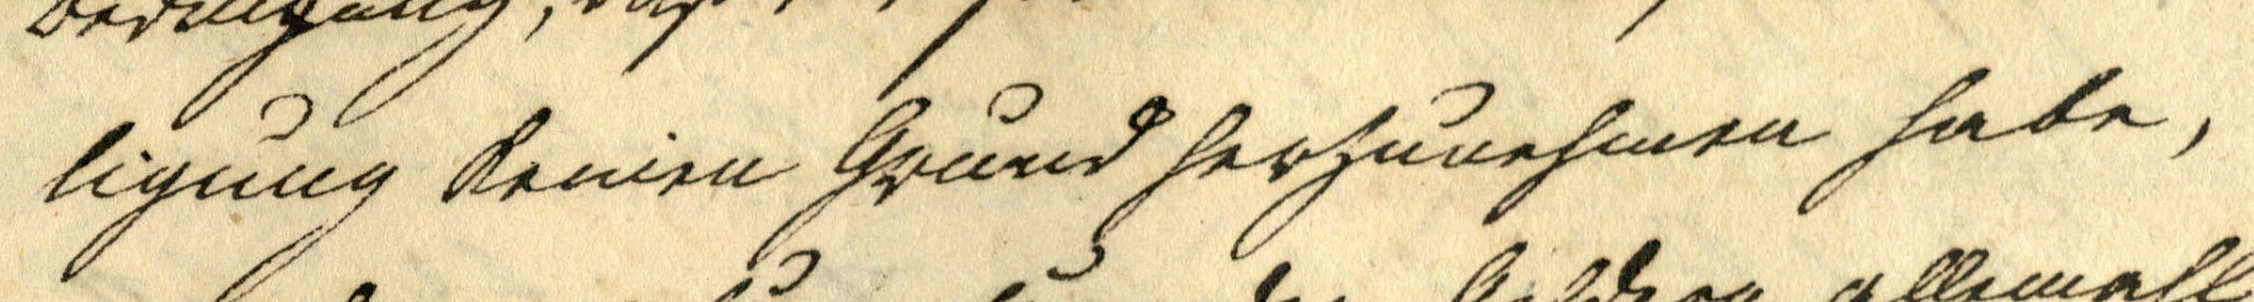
ligung keinen Grund herzunehmen habe,
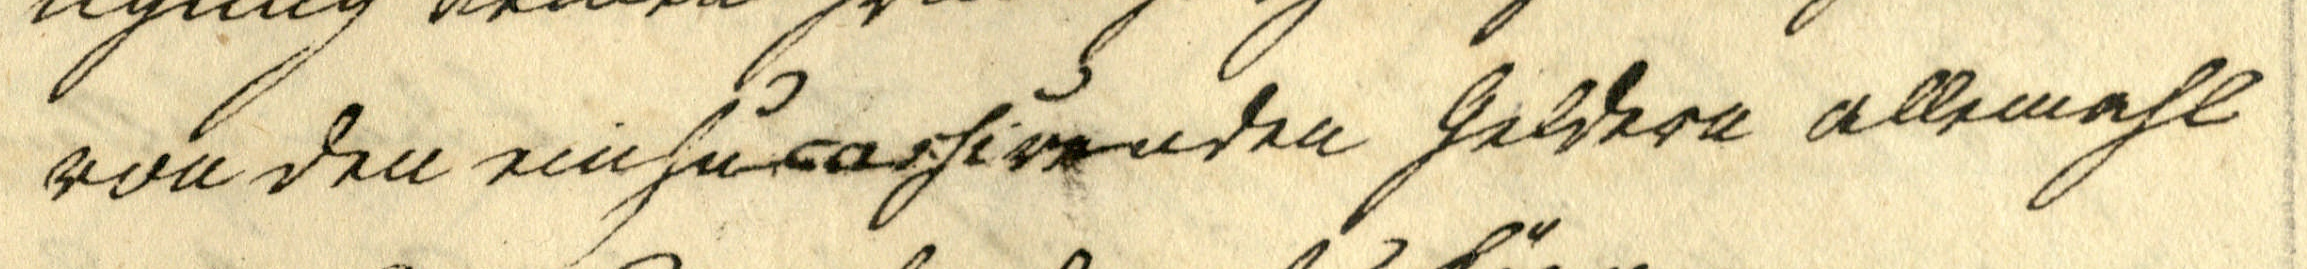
von den einzucassirenden Geldern allemahl
